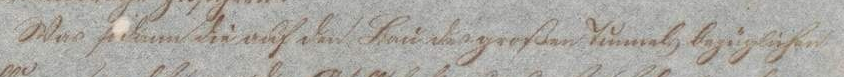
Was sodann die auf den Bau des grossen Tunnels bezüglichen
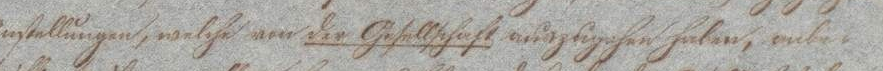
Anstellungen, welche von der Gesellschaft auszugehen haben, anbe-
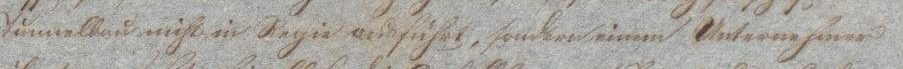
Tunnelbau nicht in Regie ausführt, sondern einem Unternehmer
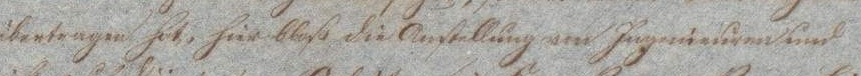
übertragen hat, hier bloß die Anstellung von Ingenieuren und
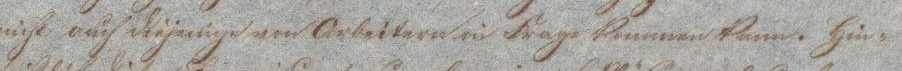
nicht auch diejenige von Arbeitern in Frage kommen kann. Hin-
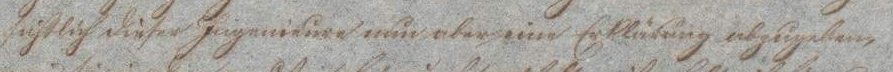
sichtlich dieser Ingenieure nun aber eine Erklärung abzugeben,
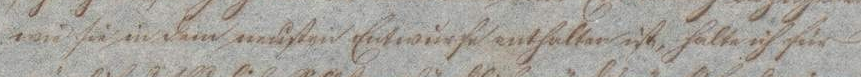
wie sie in dem neusten Entwurfe enthalten ist, halte ich für
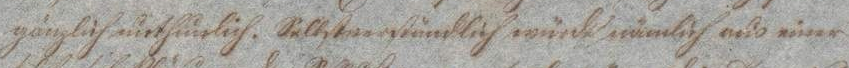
gänzlich unthunlich. Selbstverständlich würde nämlich uns einer
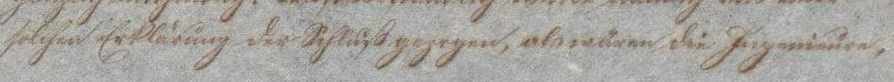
solchen Erklärung der Schluß gezogen, als wären die Ingenieure,
